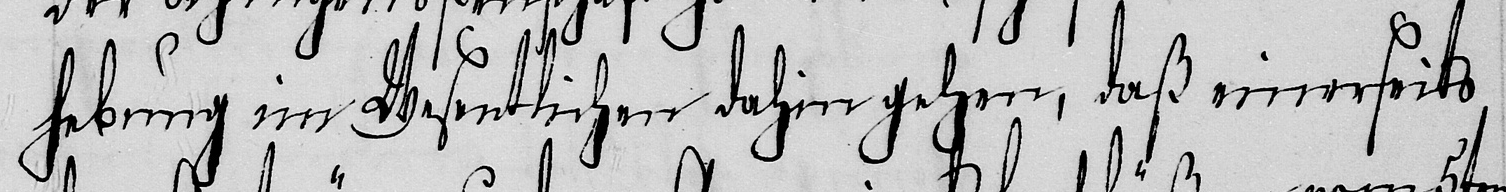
hebung im Wesentlichen dahin gehen, daß einerseits
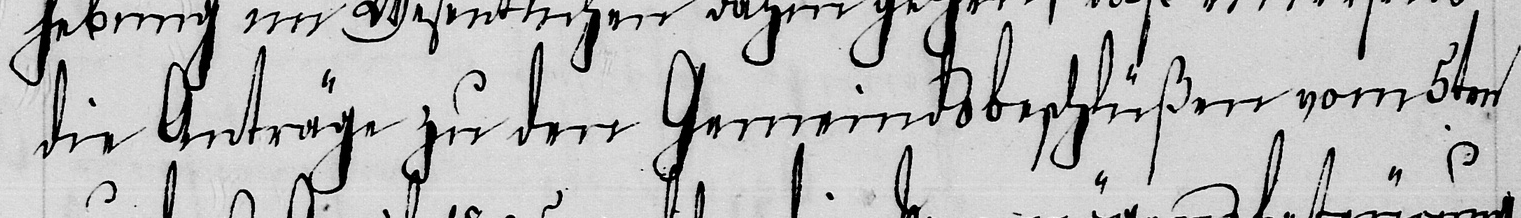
die Anträge zu den Gemeindsbeschlüßen vom 5ten
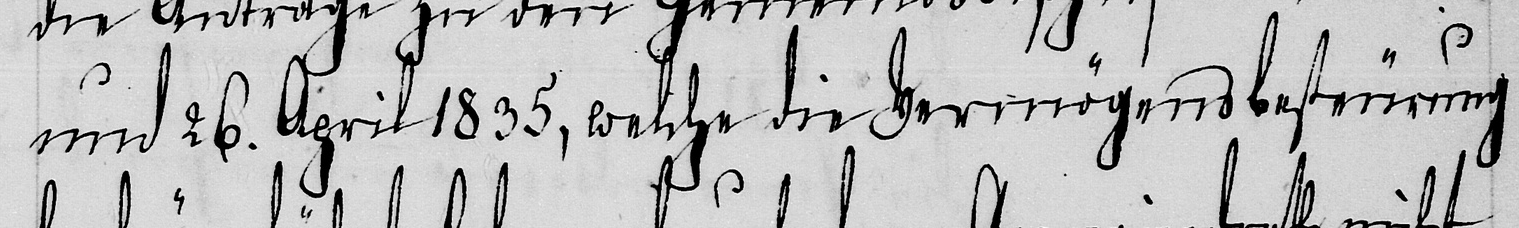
und 26. April 1835, welche die Vermögensbesteurung
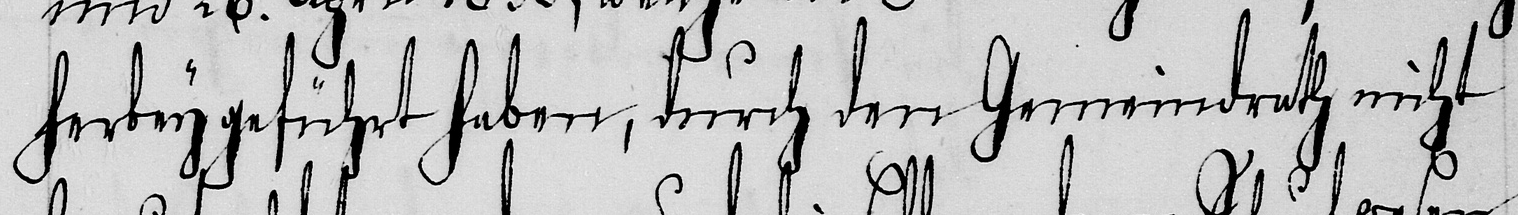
herbeygeführt haben, durch den Gemeindrath nicht
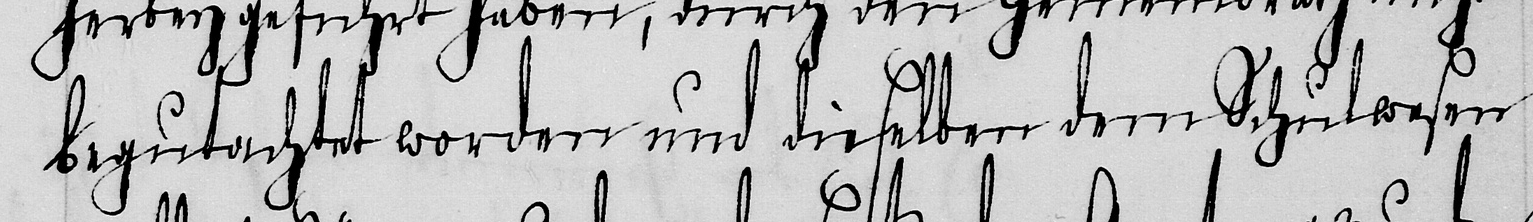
begutachtet worden und dieselben dem Schulwesen
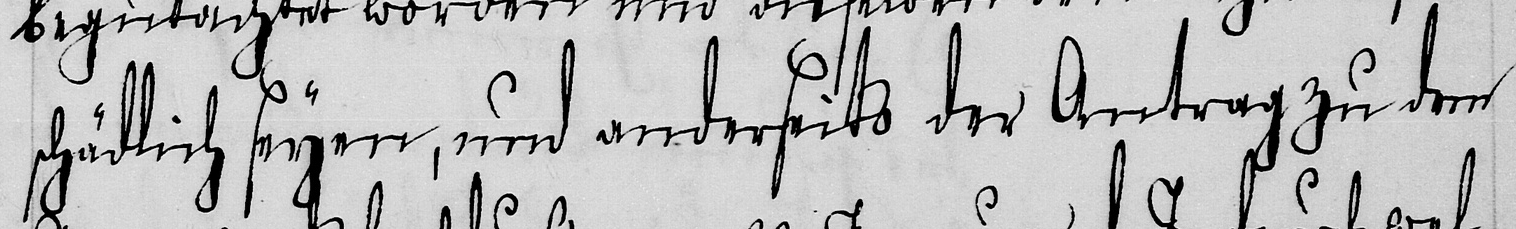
chädlich seyen, und anderseits der Antrag zu dem
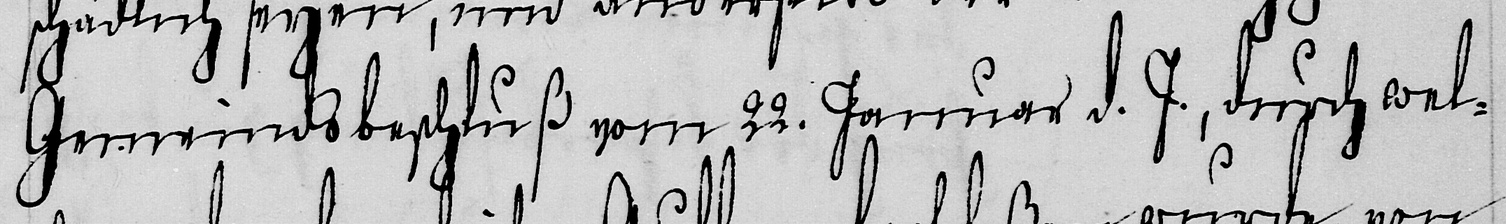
Gemeindsbeschluß vom 22. Januar d. J., durch wel¬
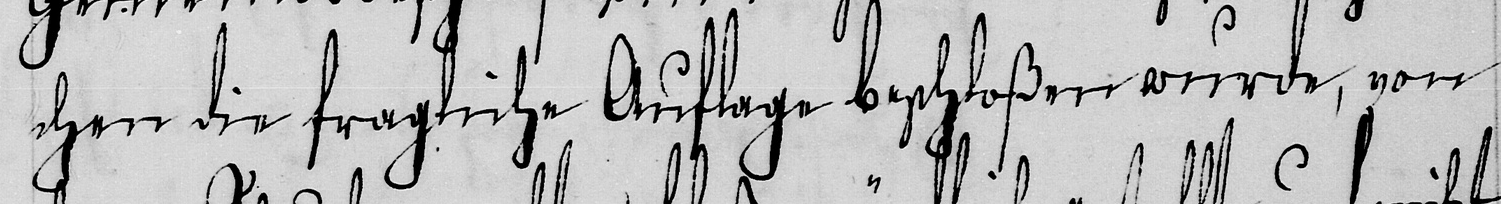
chen die fragliche Auflage beschloßen wurde, von
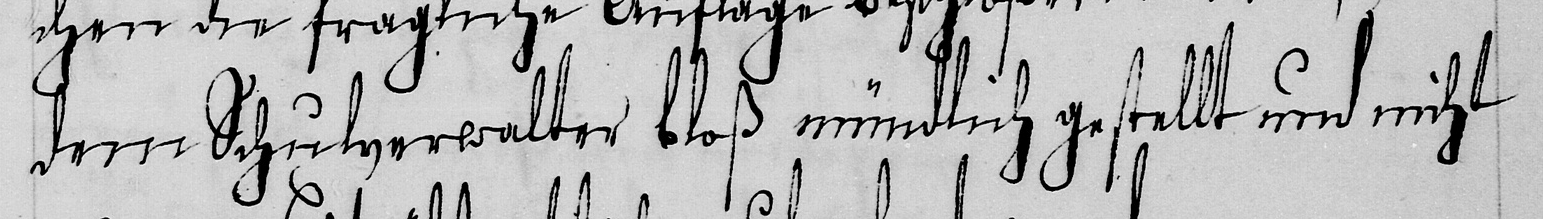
dem Schulverwalter bloß mündlich gestellt und nicht
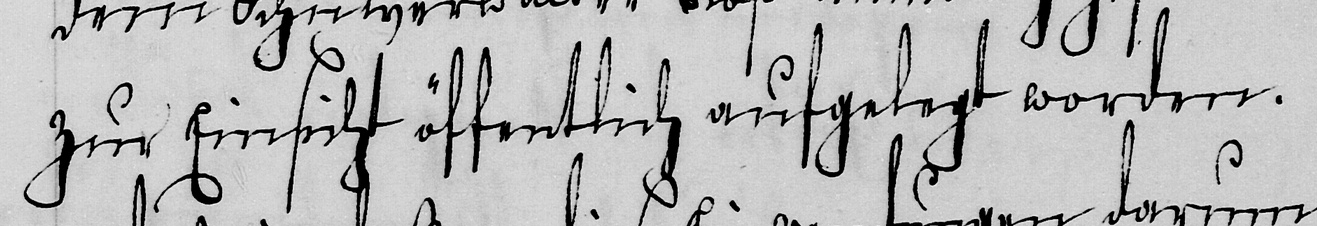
zur Einsicht öffentlich aufgelegt worden.
